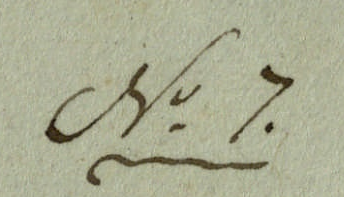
Nº 7.
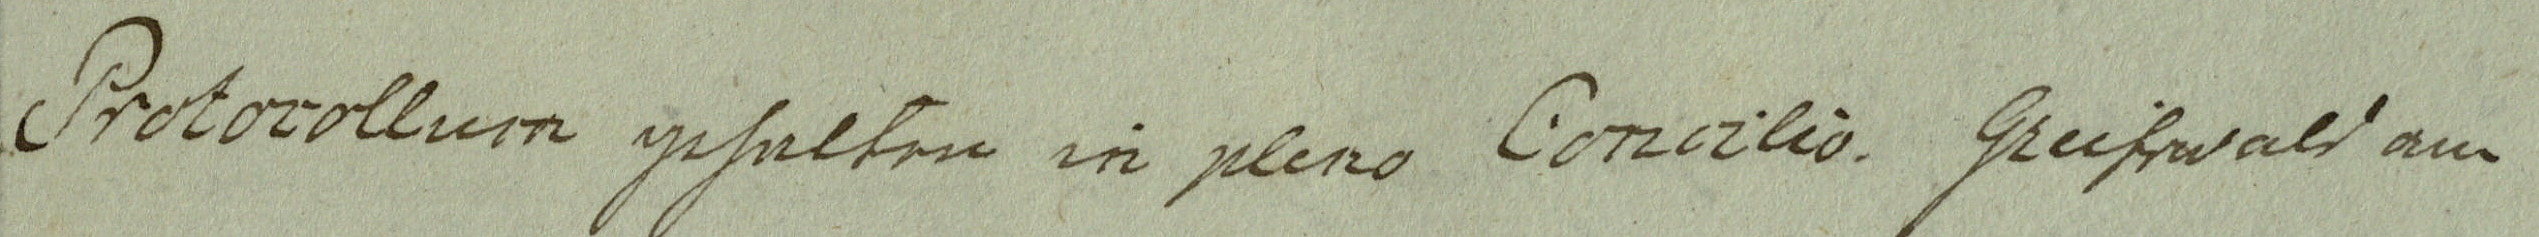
Protocollum gehalten in pleno Concilio. Greifswald am
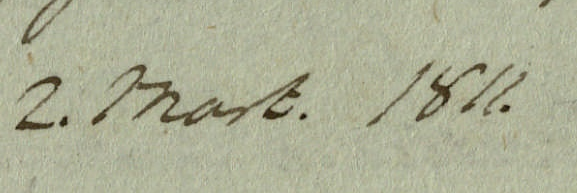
2. Mart. 1811.
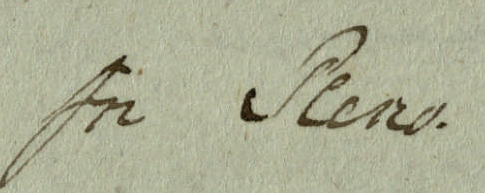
In Pleno.
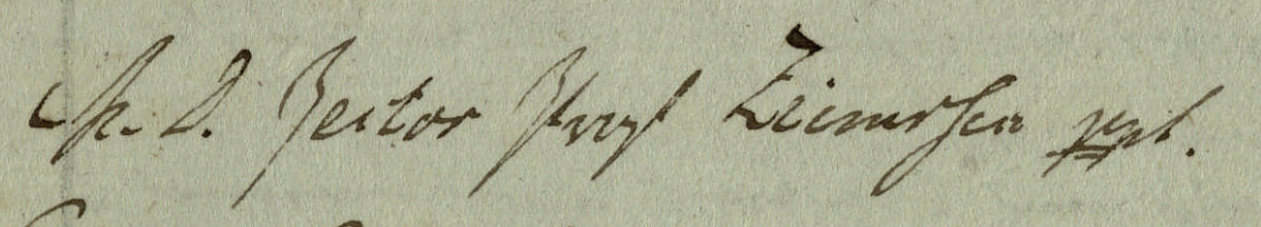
M. D. Rector Prof. Ziemssen ppt.
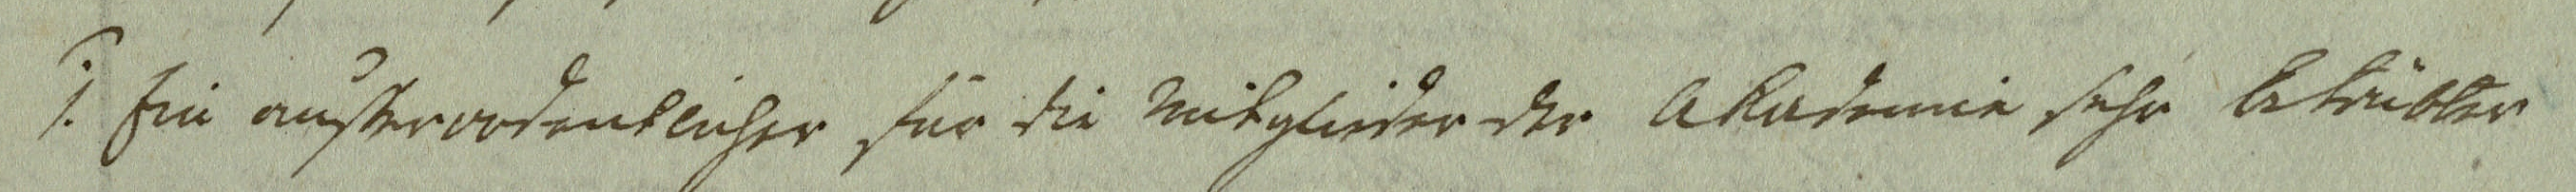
1. Ein außerordentlicher für die Mitglieder der Akademie sehr betrübter
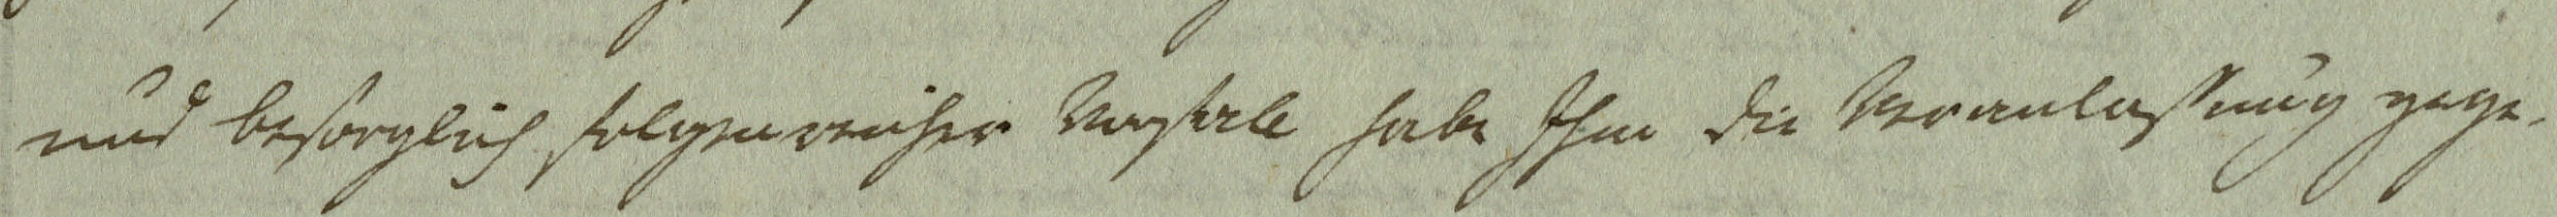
und besorglich folgenreicher Vorfall habe Ihm die Veranlassung gege¬
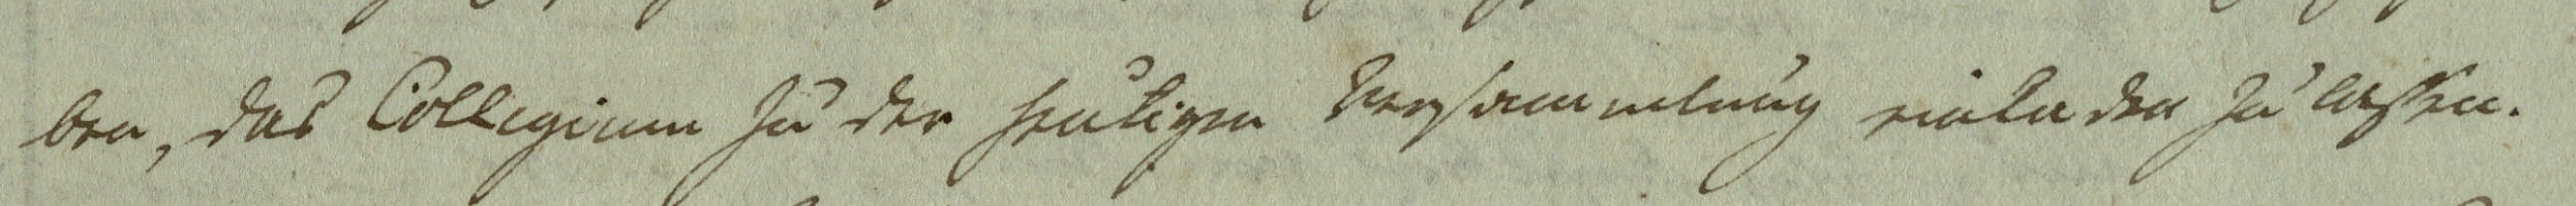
ben, das Collegium zu der heutigen Versammlung einladen zu lassen.
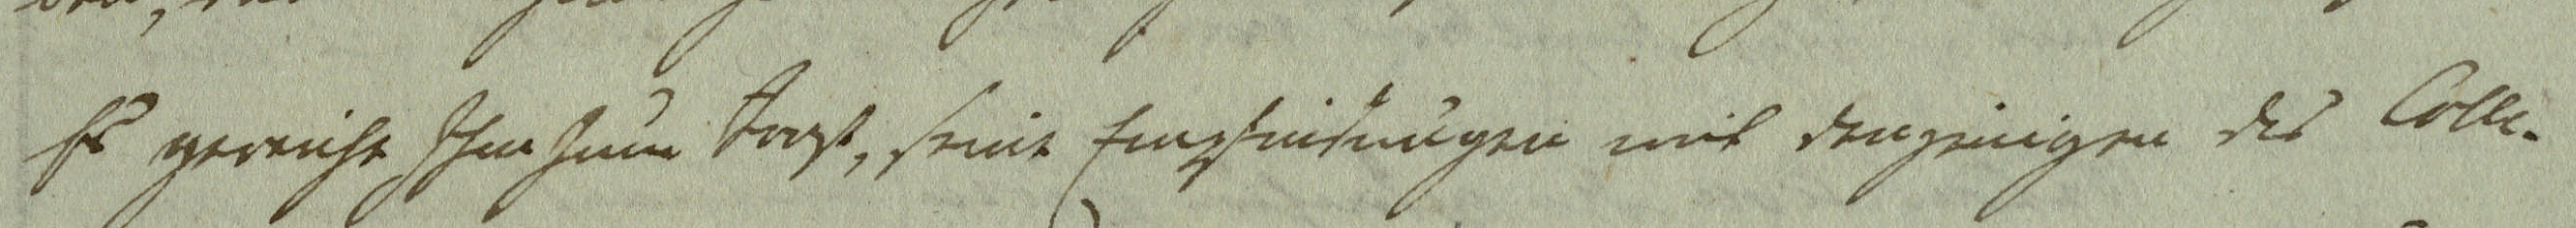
Es gereicht Ihm zum Trost, seine Empfindungen mit denjenigen des Colle¬
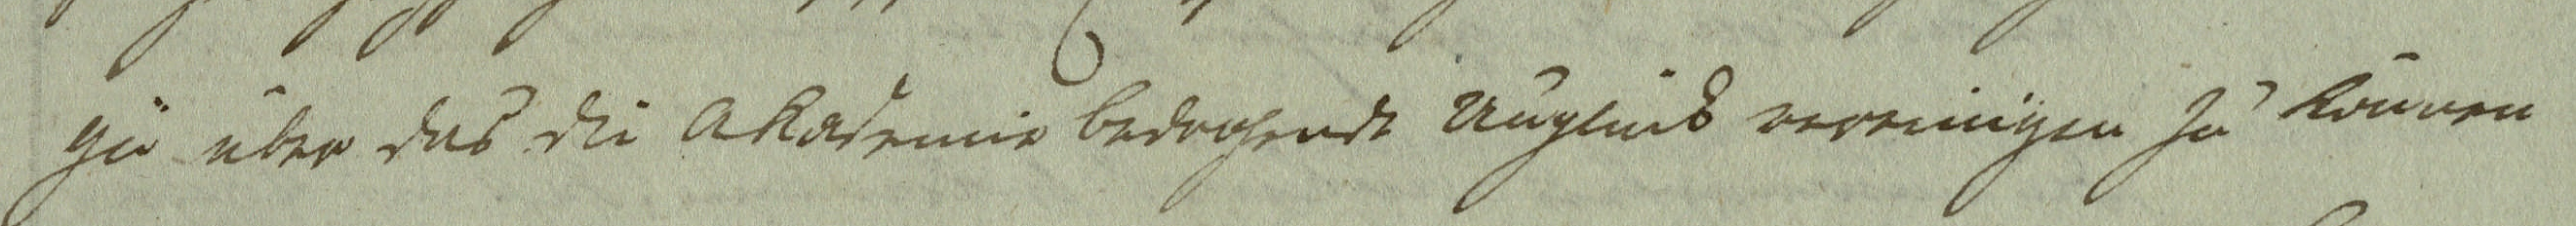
gii über das die Akademie bedrohende Unglück vereinigen zu können
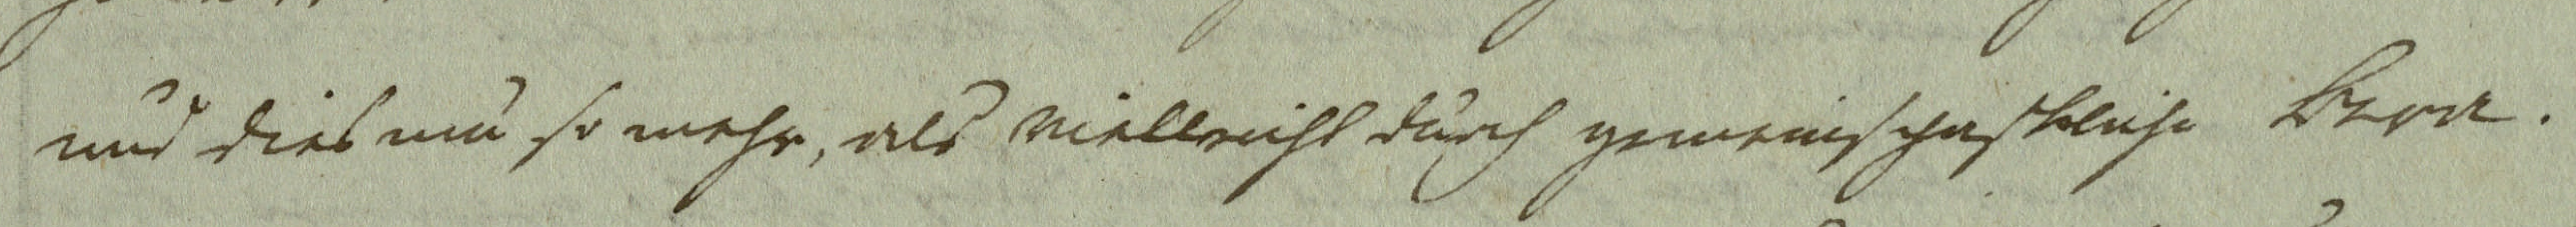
und dies um so mehr, als vielleicht durch gemeinschaftliche Bera¬
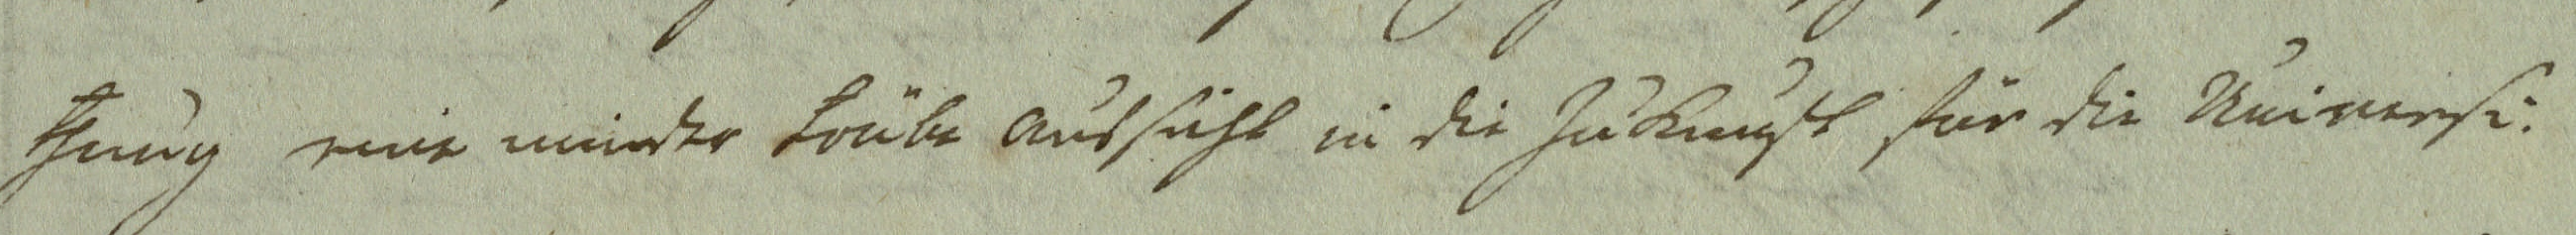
thung eine minder trübe Aussicht in die Zukunft für die Universi¬
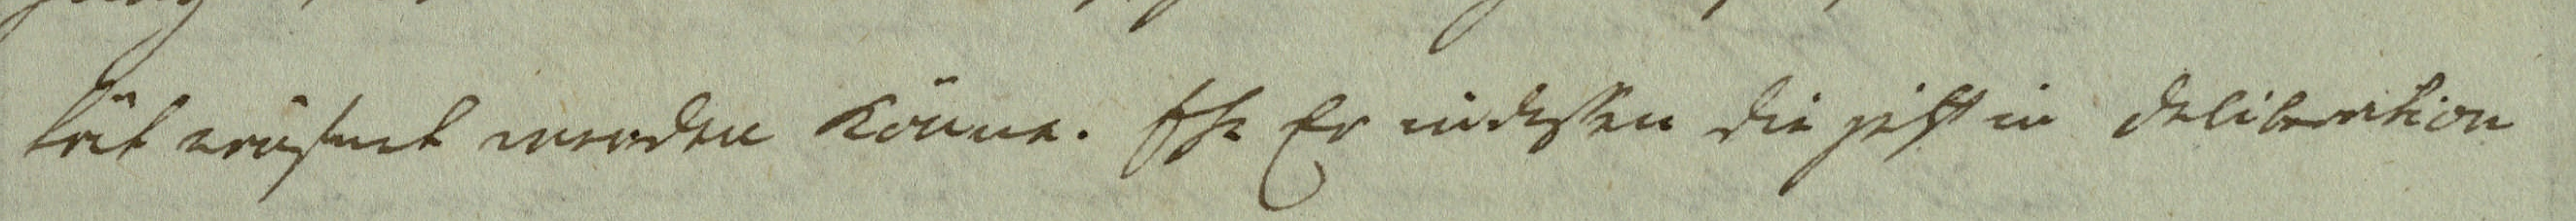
tät eröfnet werden könne. Ehe Er indessen die jetzt in deliberation
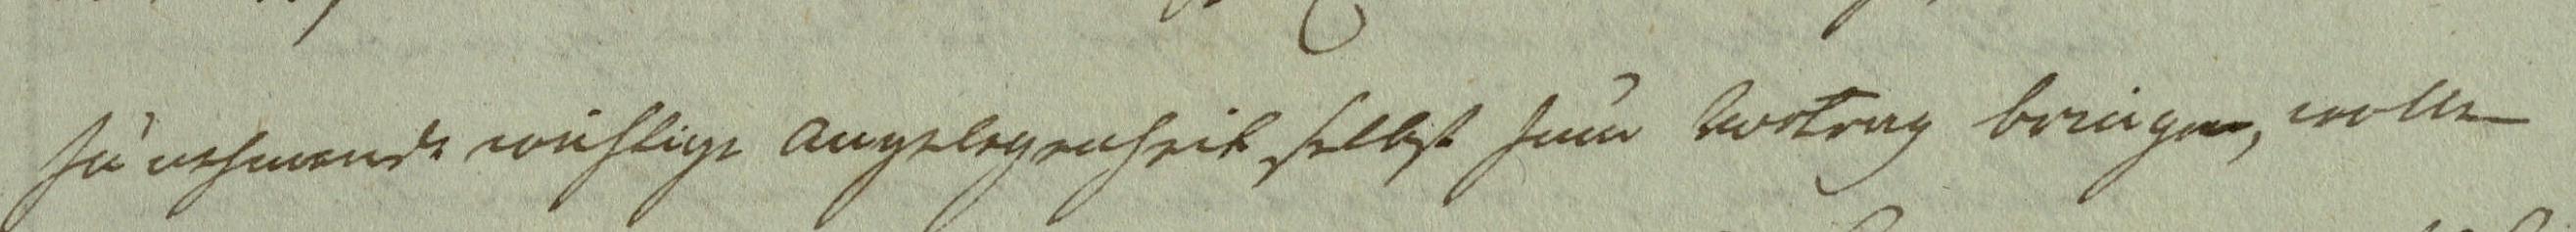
zu nehmende wichtige Angelegenheit selbst zum Vortrag bringen, wolle
